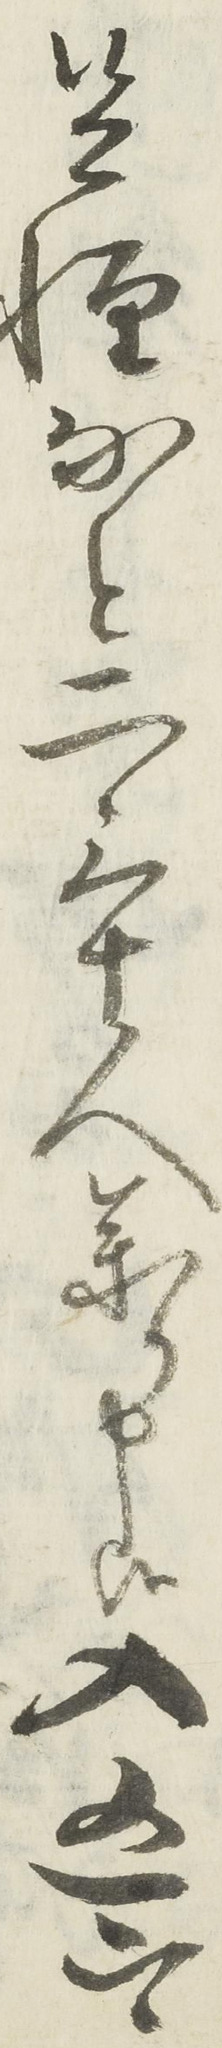足軽なとニ三十人参り申候入込候はヽ
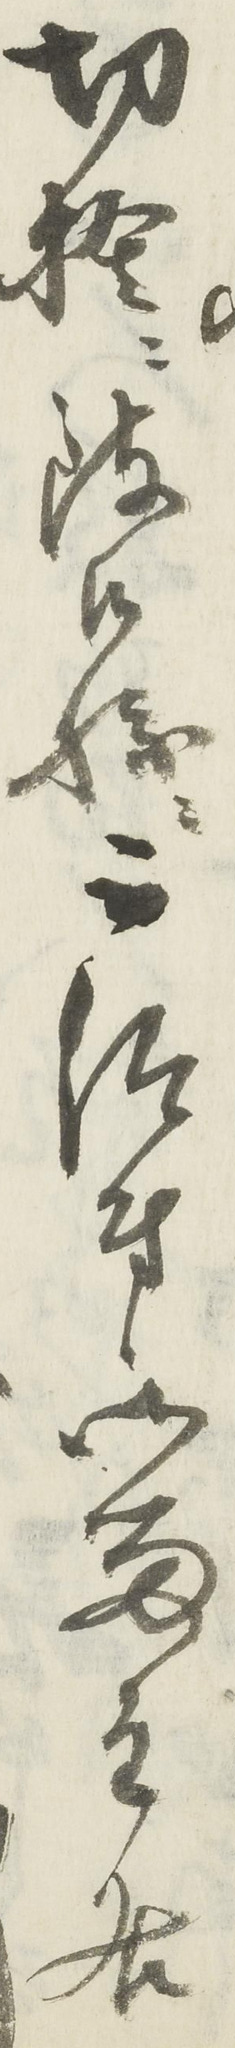切捨ニ致候様二被仰付候御留守居
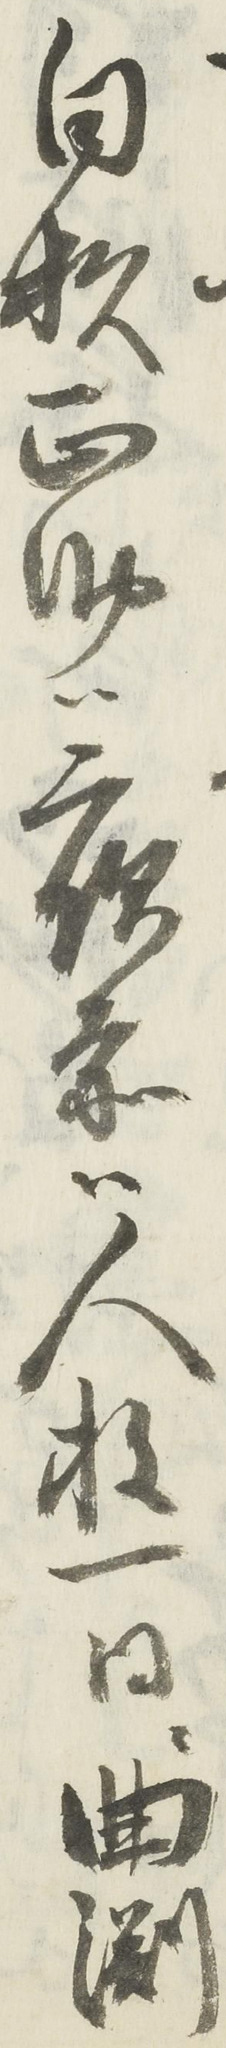白杉正助は夜前は人数一同ニ曲渕
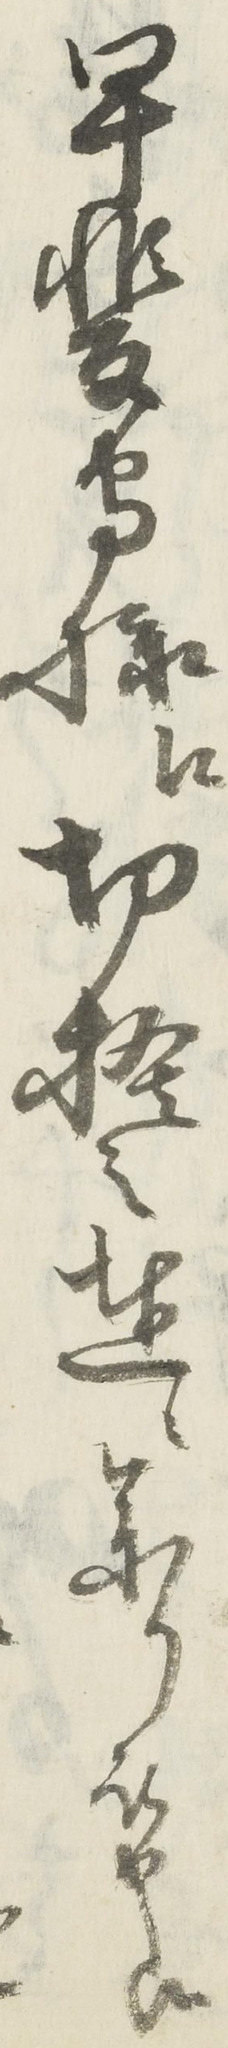甲斐守様え切捨之達ニ参り被申候
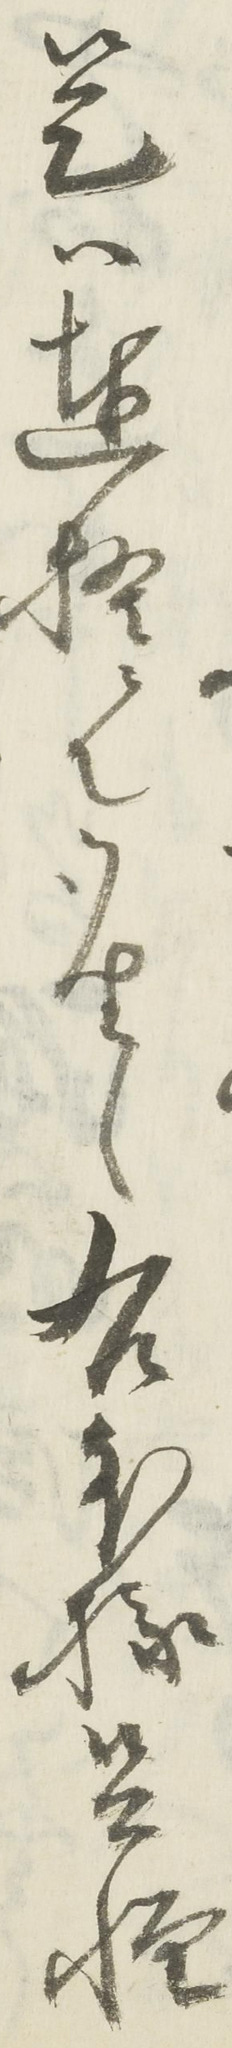是は達捨ニて御坐候右外様足軽
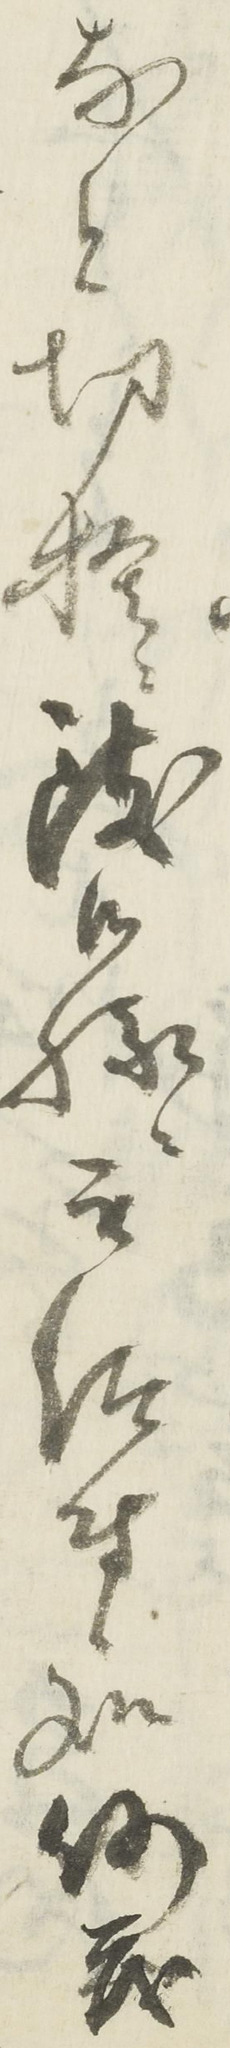なと切捨ニ致候様二被仰付候処何も
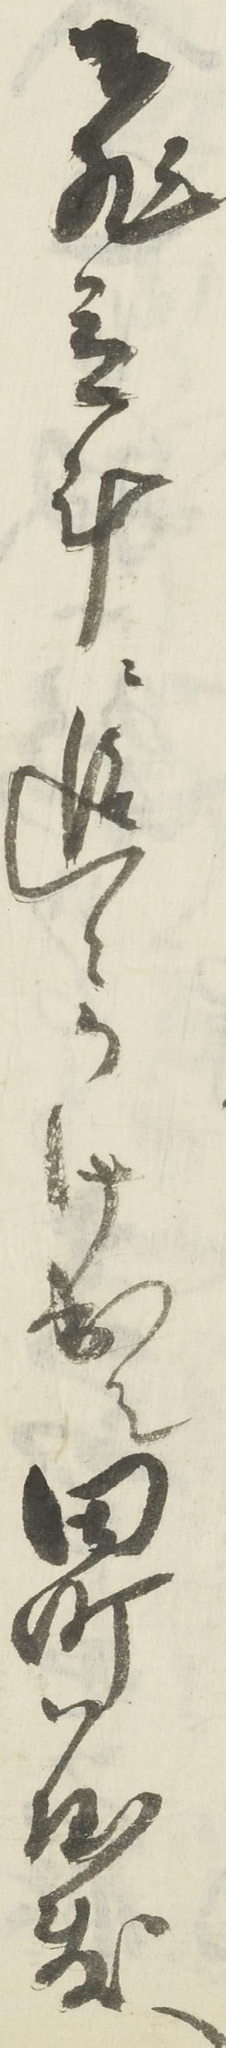飛立計ニ追〻かけ出シ田町御屋敷へ
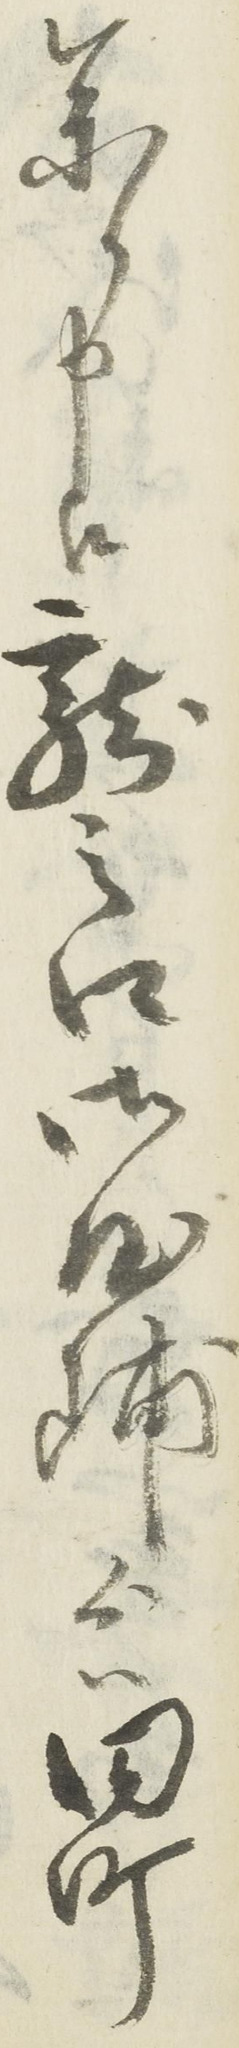参り申候龍之口御屋鋪ゟは田町
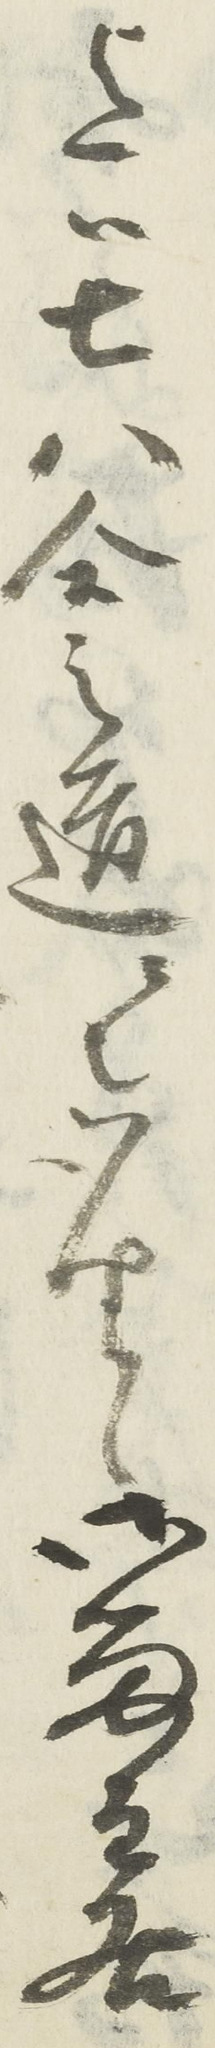迄は七八合之道ニて御坐候御留守居
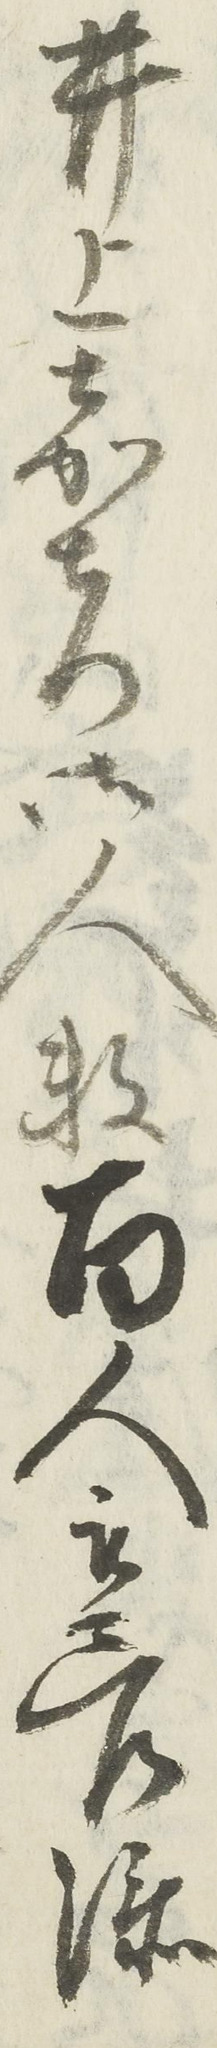井上嘉右衛門御人数百人被差添
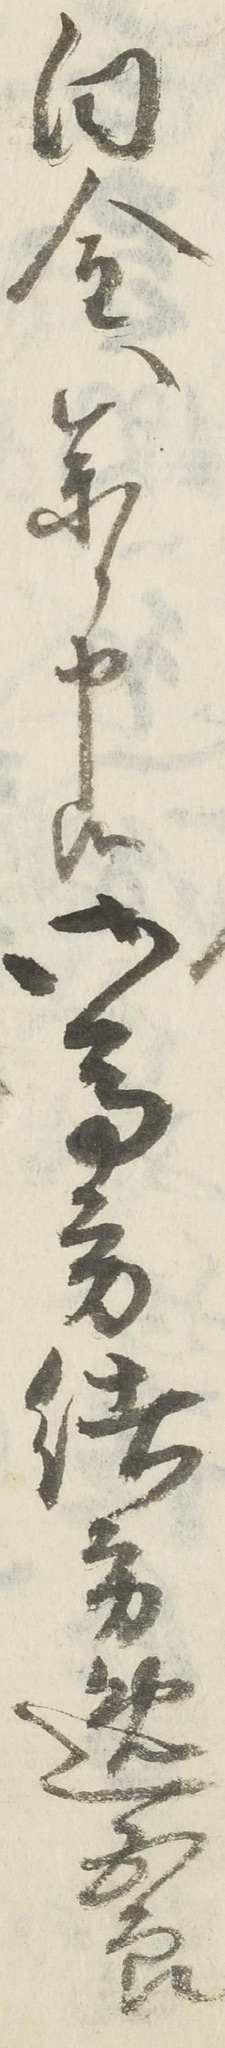白金へ参り申候御馬方徒方逸五良
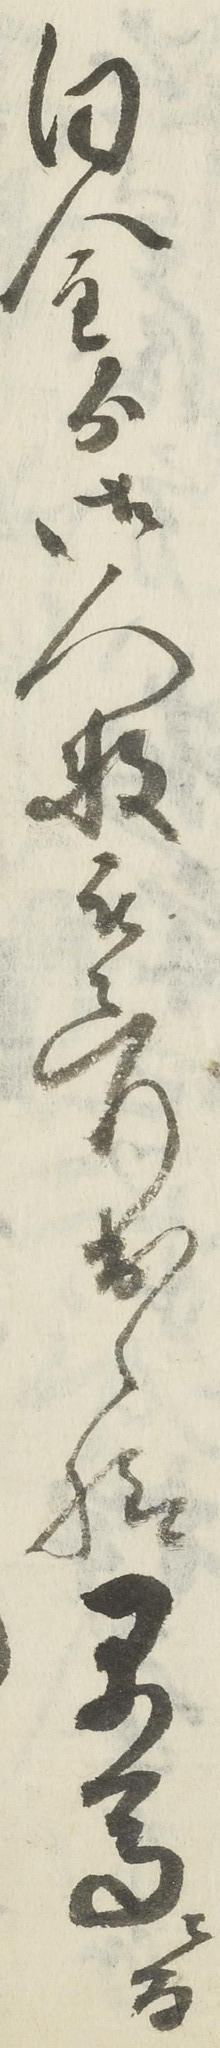白金ゟ御人数被差出候様早馬ニ而
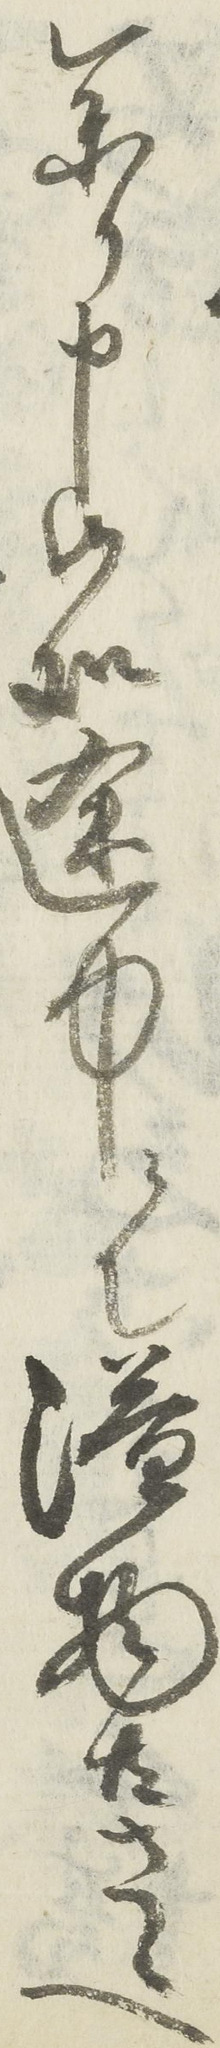参り申候処途中ニて溢物共さゝへ
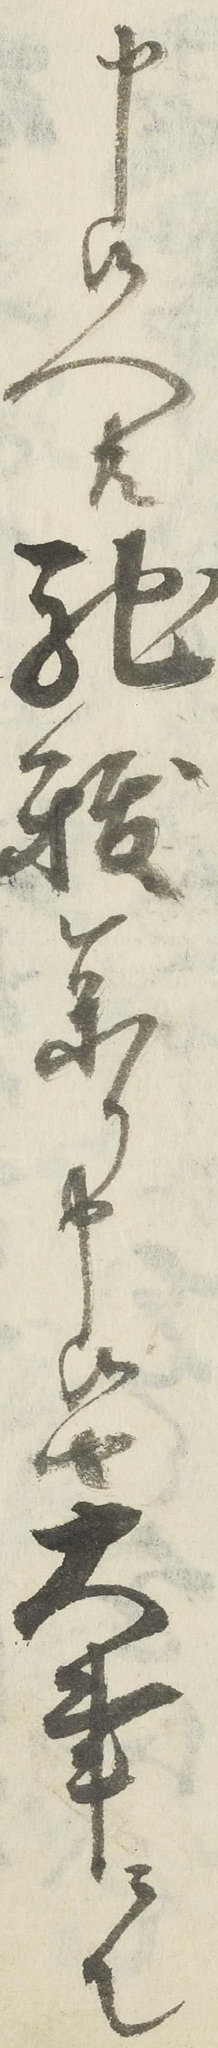申候へ共馳抜参り申候は大事ニて
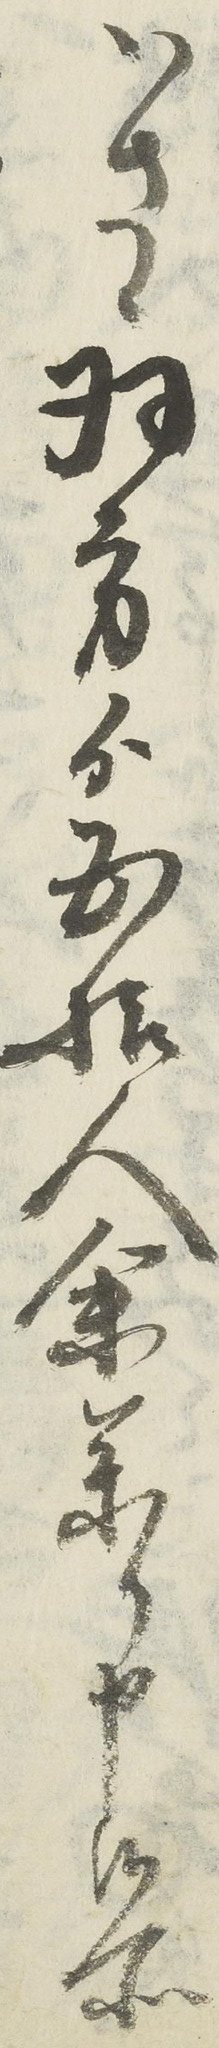御さ候双方ゟ五拾人余参り申候所
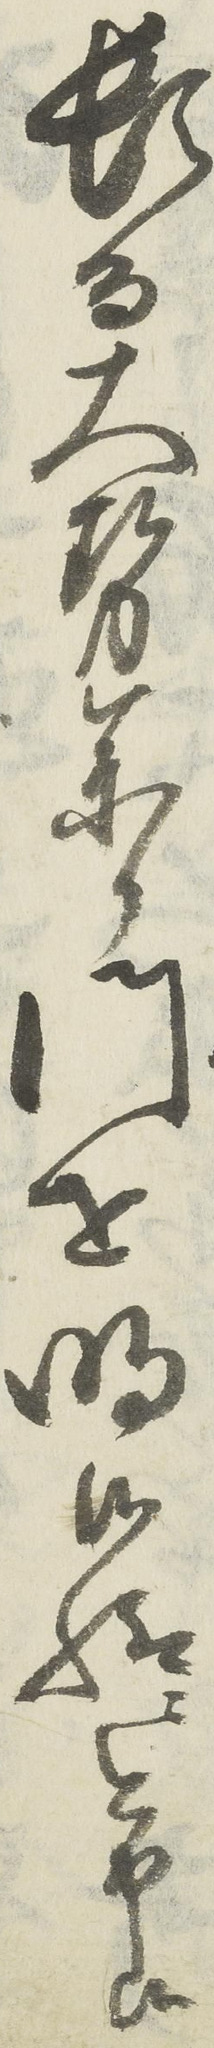頓而大勢参り門を明候様二と申候
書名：後見笑
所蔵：東京大学地震研究所図書室 Earthquake Research Institute Library, The University of Tokyo, JAPAN
